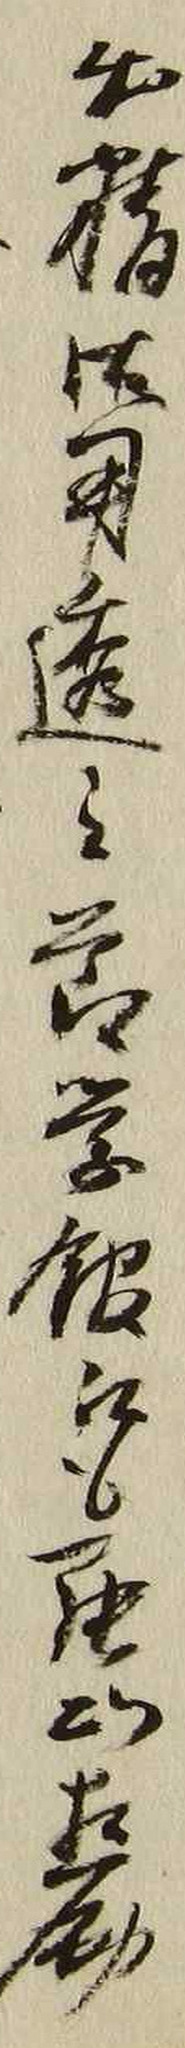出精御用透之節学館江も罷出相励
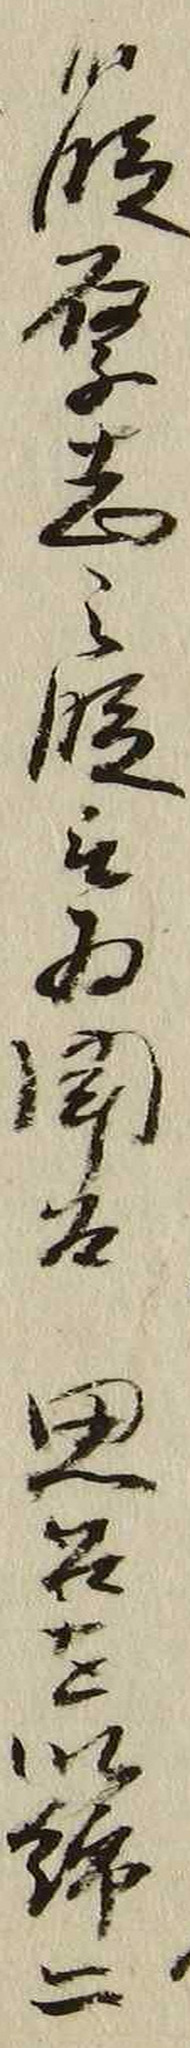候段厚志之段被為聞召思召を以綿二
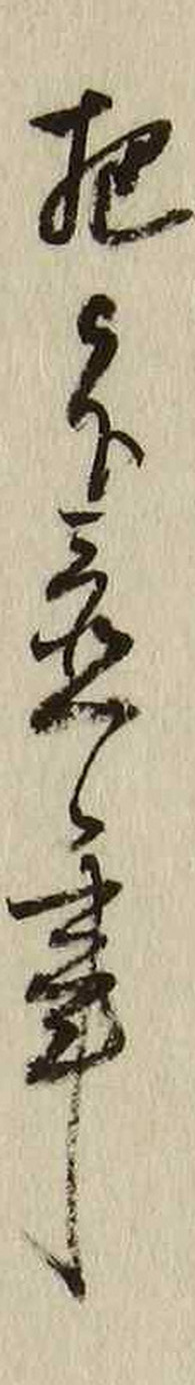把被下置候事
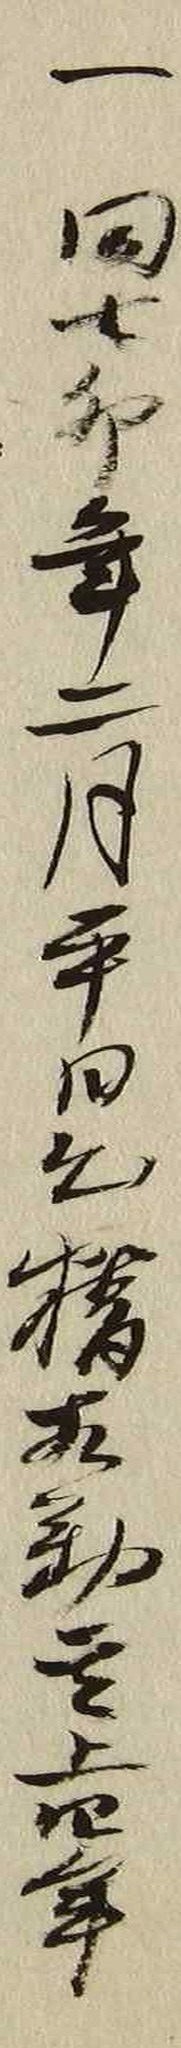一同七卯年二月平日出精相勤其上四年
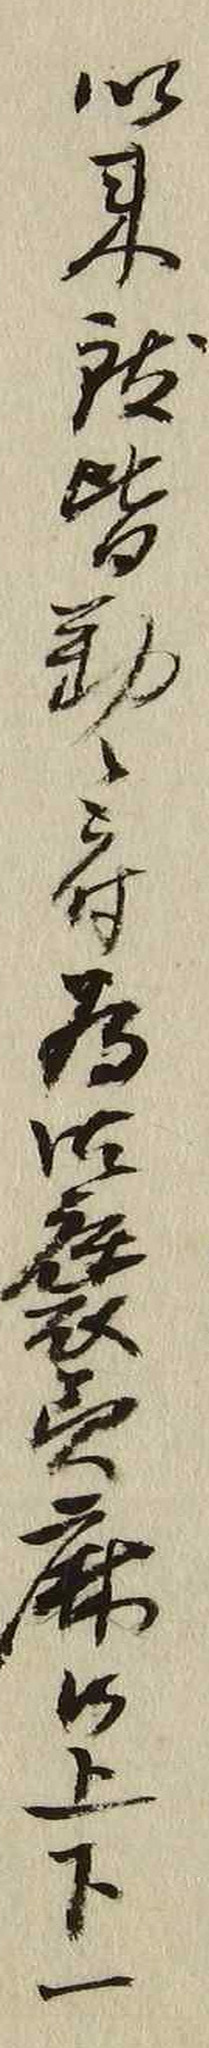以来致皆勤候ニ付為御褒美麻御上下一
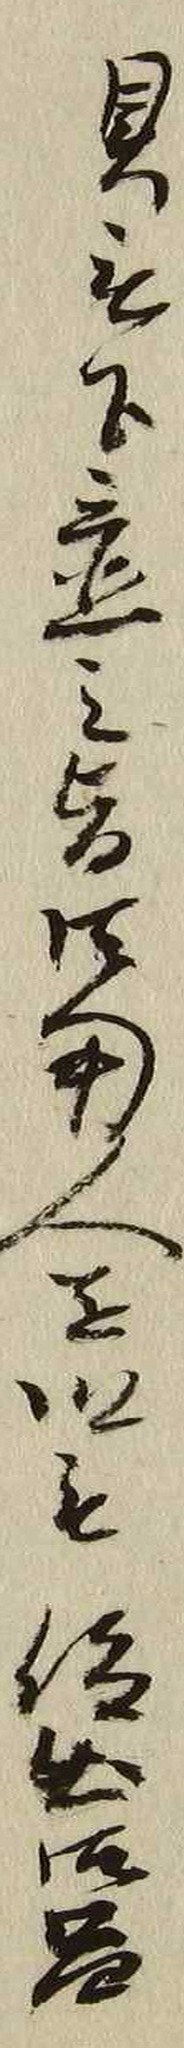具被下置之旨御用人を以被仰出御品
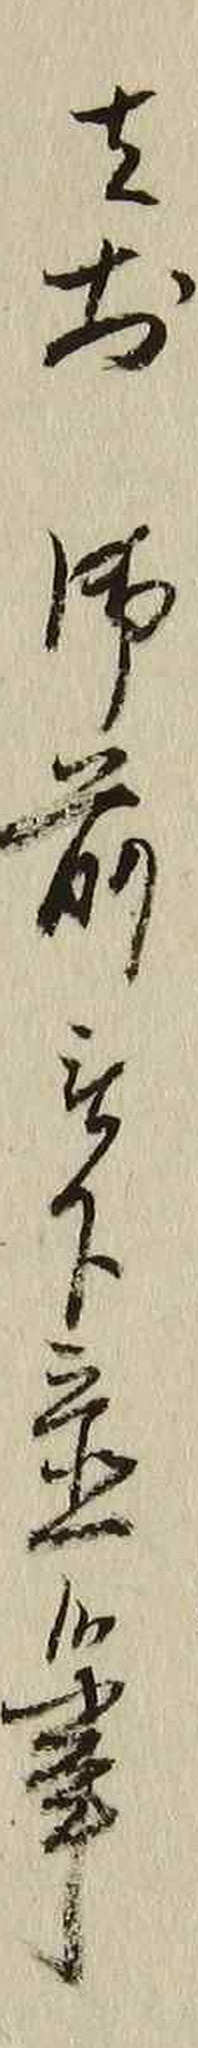者於御前被下置候事
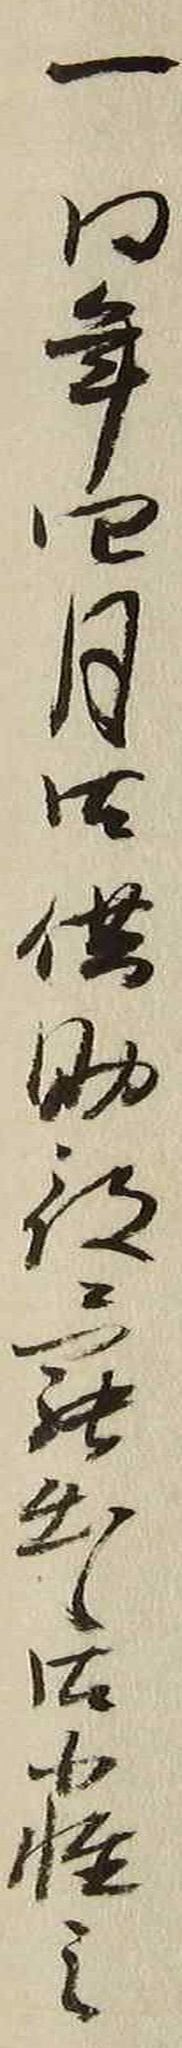一同年四月御供助役ニ罷出候御小性之
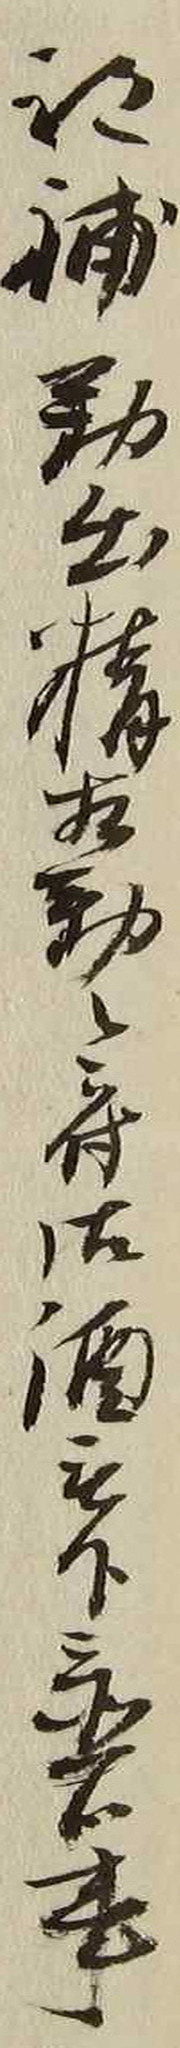跡補勤出精相勤候ニ付御酒被下置候事
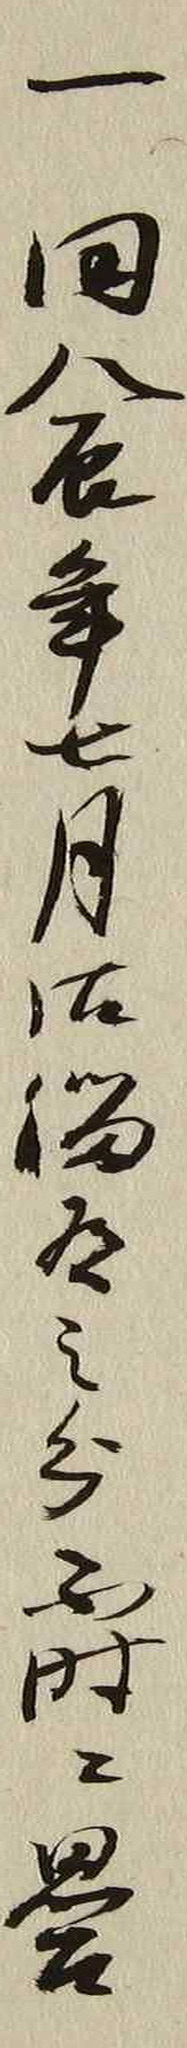一同八辰年七月御溜有之分不時ニ思召
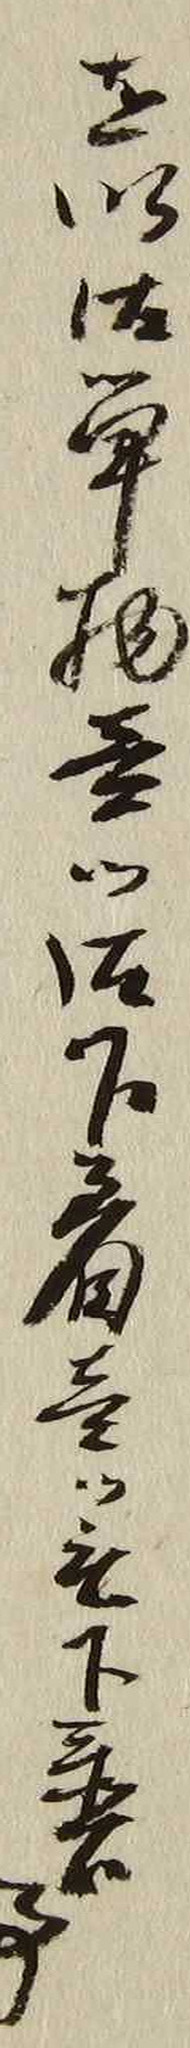を以御単物壱ツ御下着壱ツ被下置候事
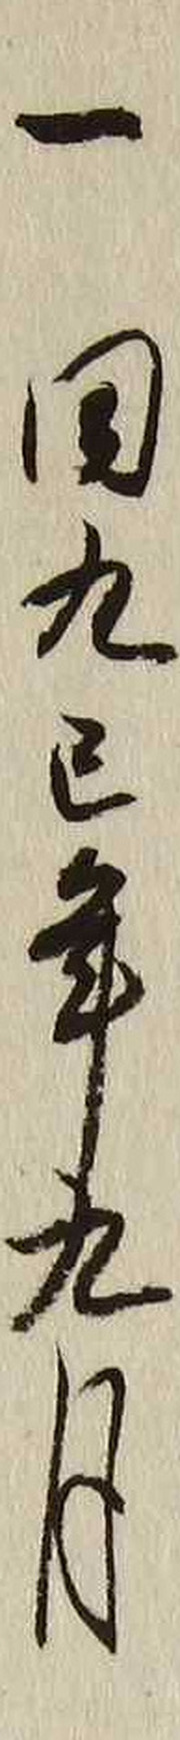一同九巳年九月
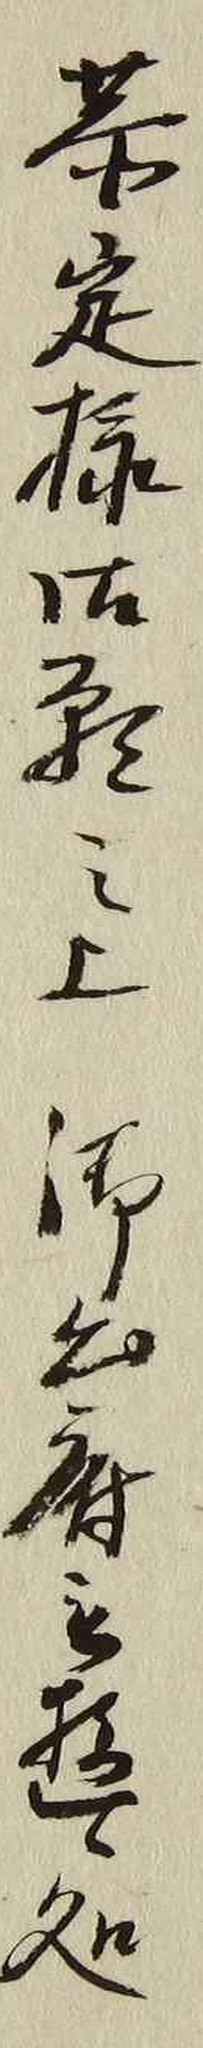恭定様御願之上御出府被遊候処
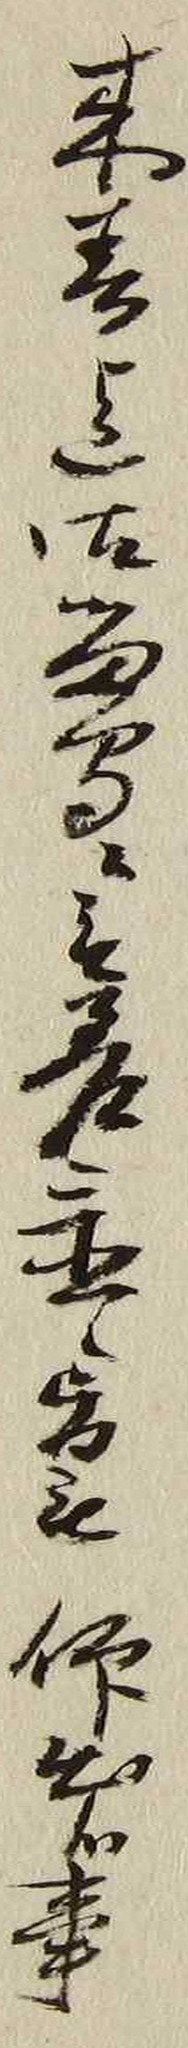来春迄御留守ニ被差置候旨被仰出候事
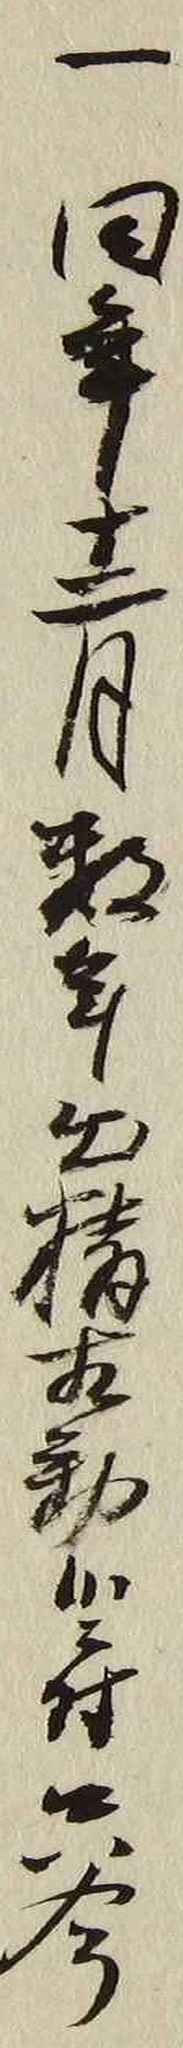一同年十二月数年出精相勤候ニ付只今
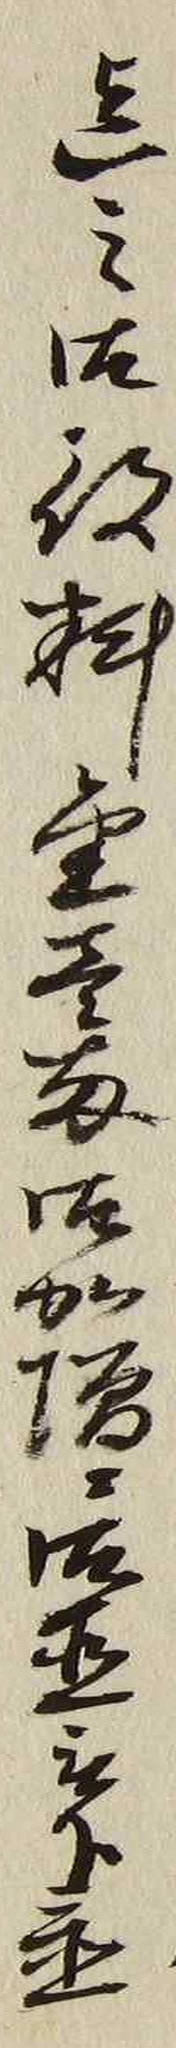迄之御役料金壱両御加増ニ御直被下置
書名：諸士系譜　巻之345　も之部1
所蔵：会津若松市立会津図書館
